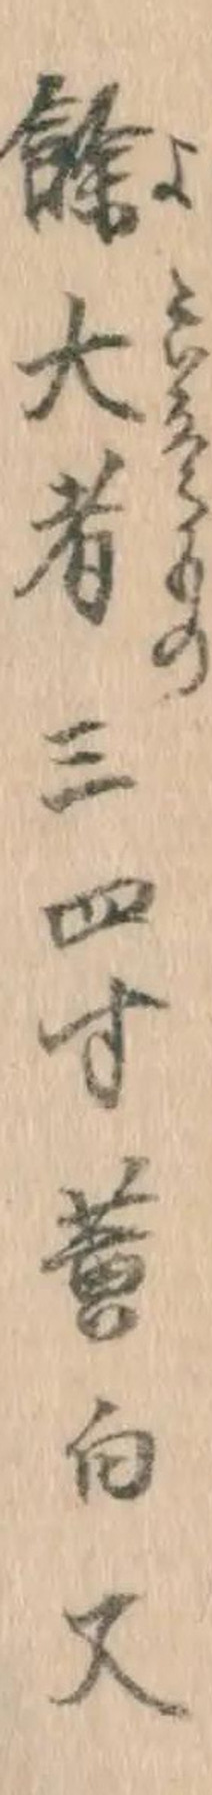余大者三四寸黄白又
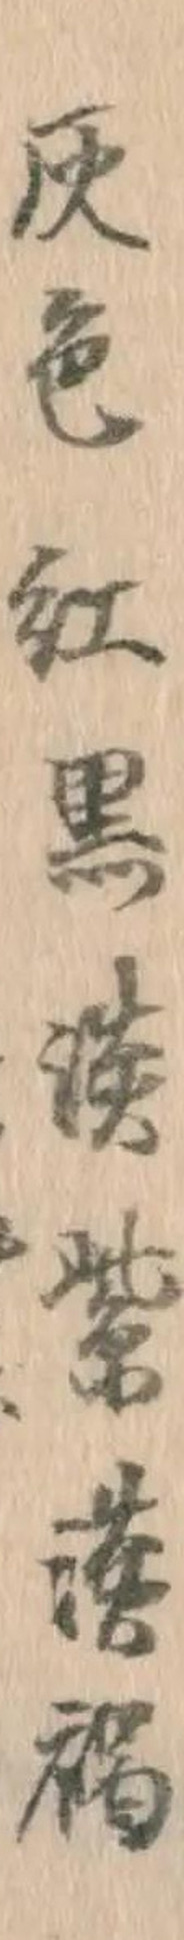灰色紅黒淡紫淡褐
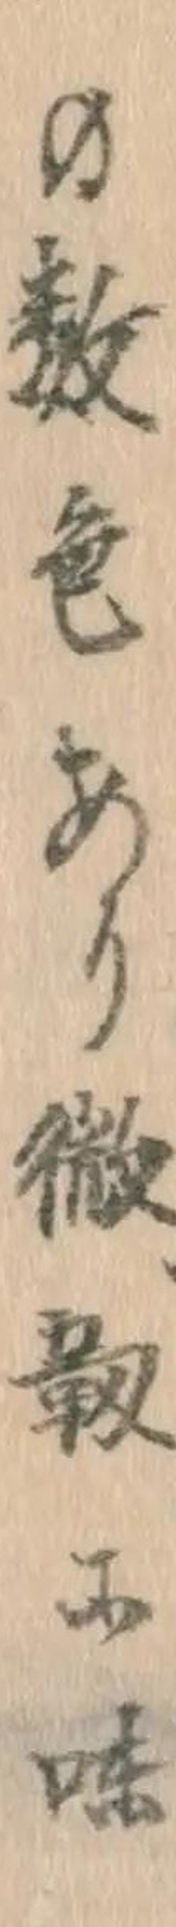の数色あり微韌に味
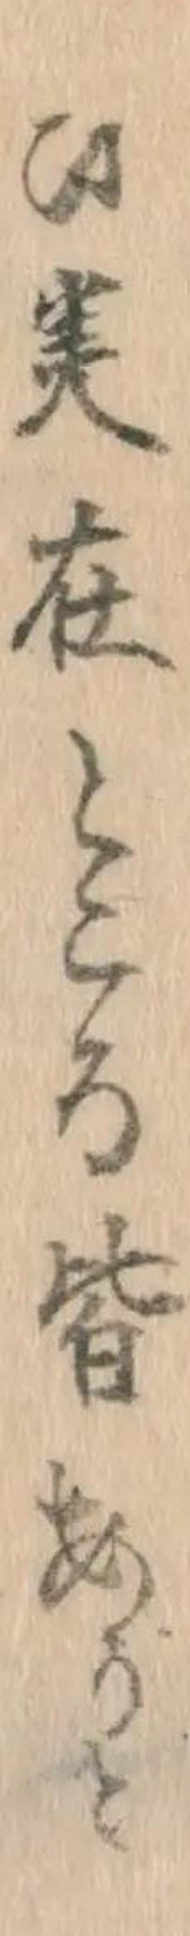ひ美在ところ皆ありと
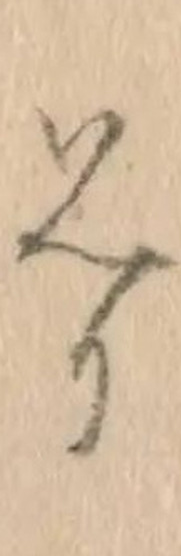いへり

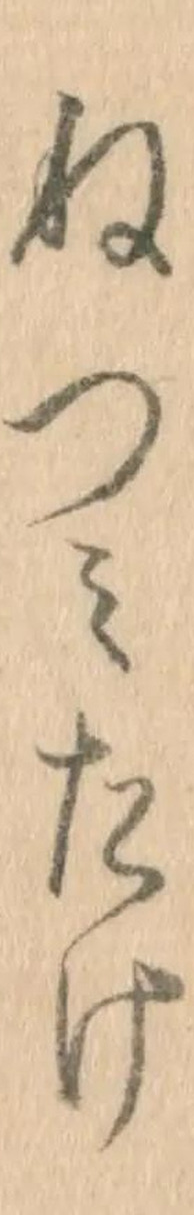ねつみたけ
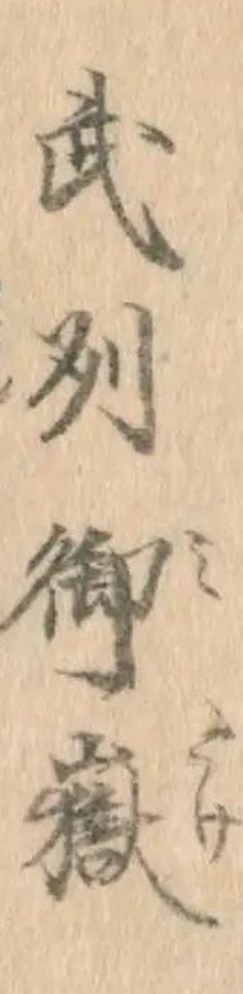武州御岳
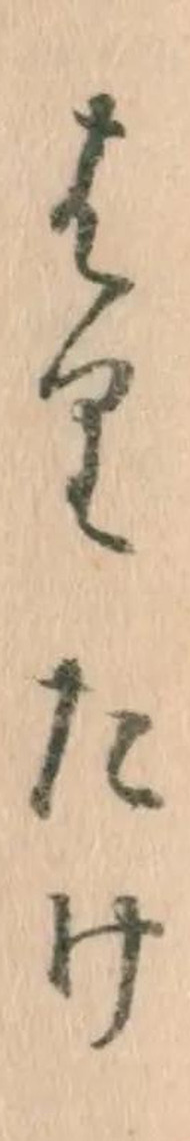はりたけ
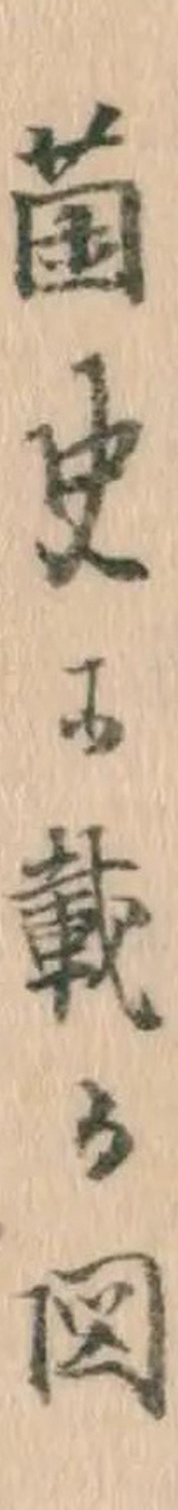菌史に載る図
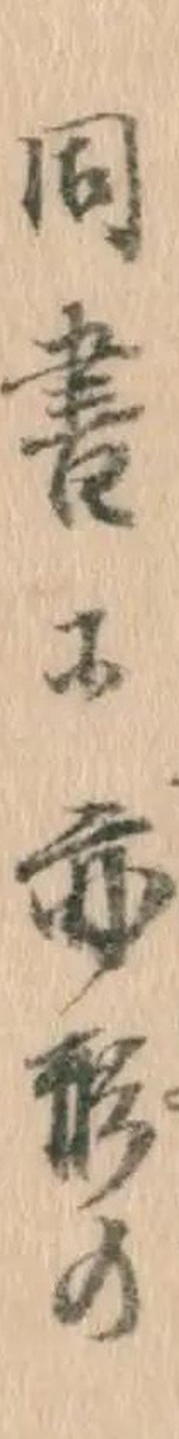同書に亦形の
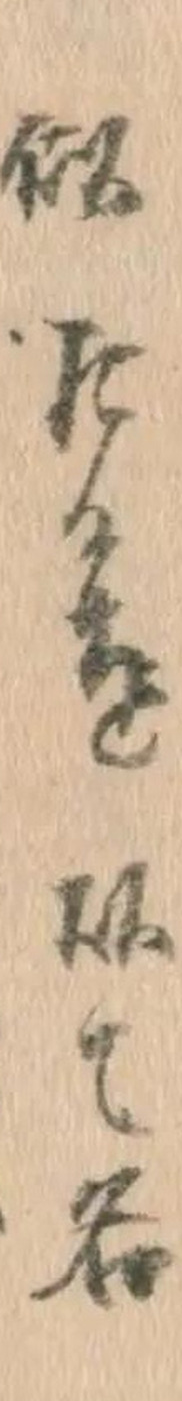似たるを以て名
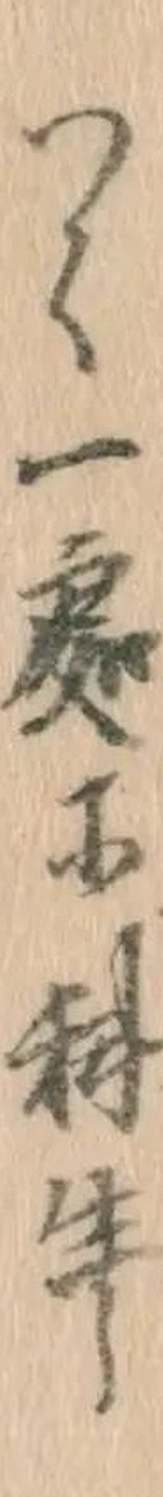つく一処に科生し
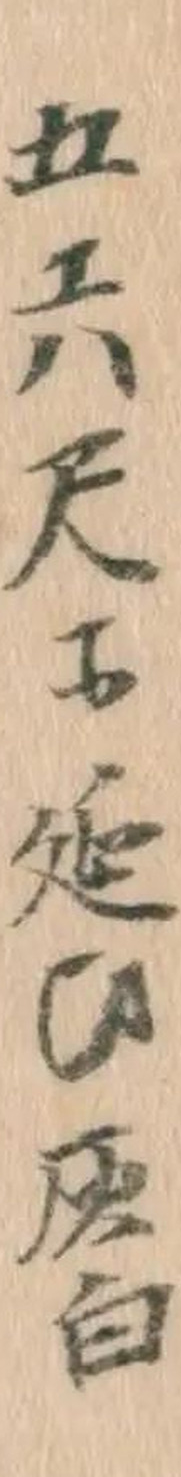五六尺に延ひ灰白
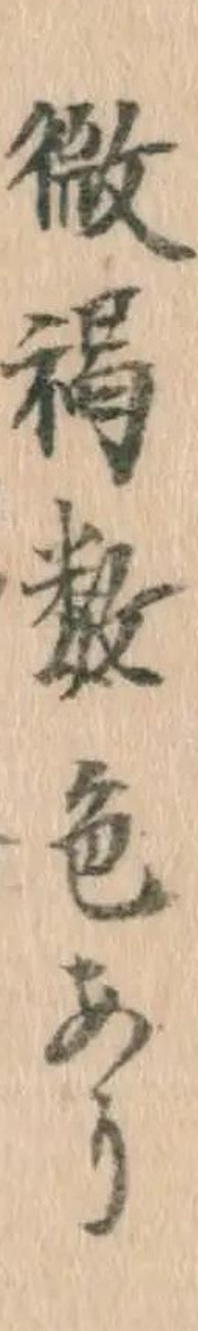微褐数色あり
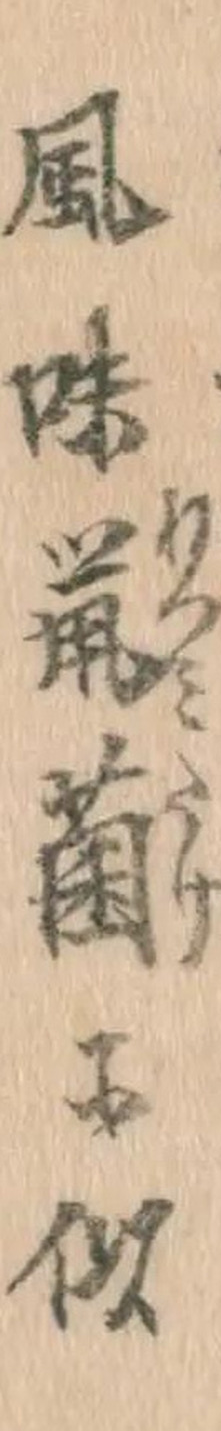風味鼠菌に似
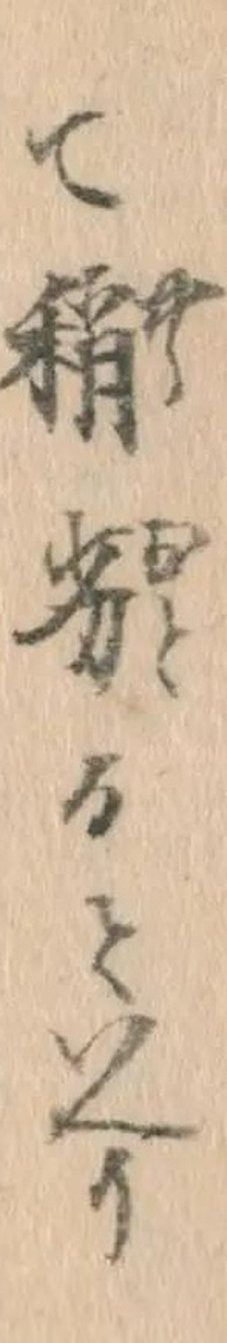て稍劣るといへり
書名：本草図譜. 巻58-60
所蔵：国立国会図書館 National Diet Library, JAPAN
